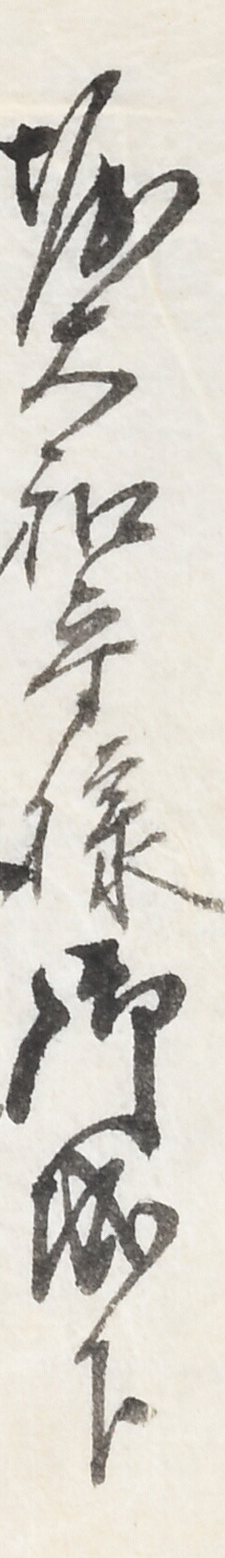堀大和守様御城下
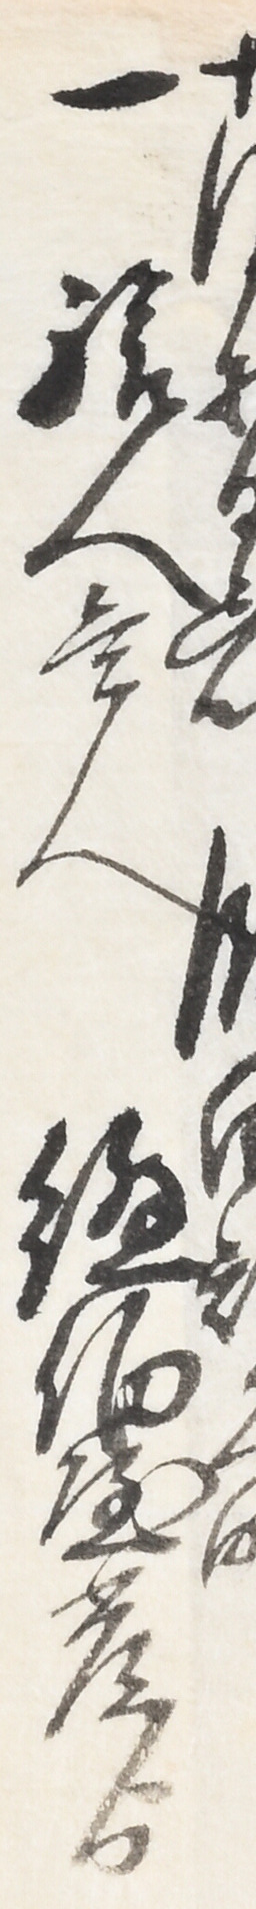一旅人壱人縫伯屋彦郎
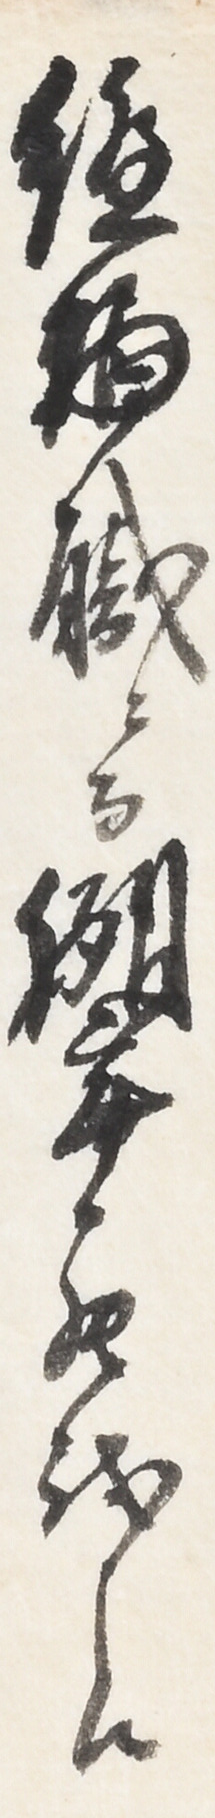縫伯職ニ而例年罷越申候
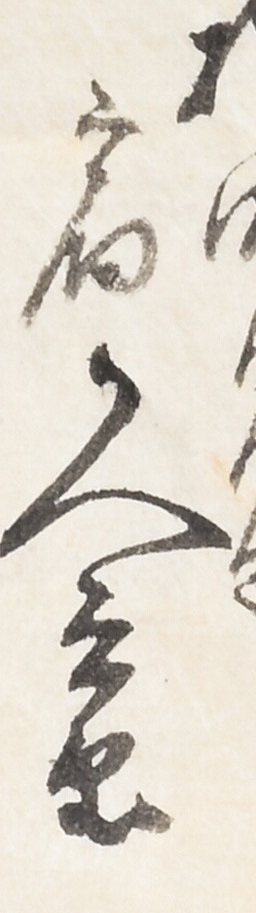宿久兵衛
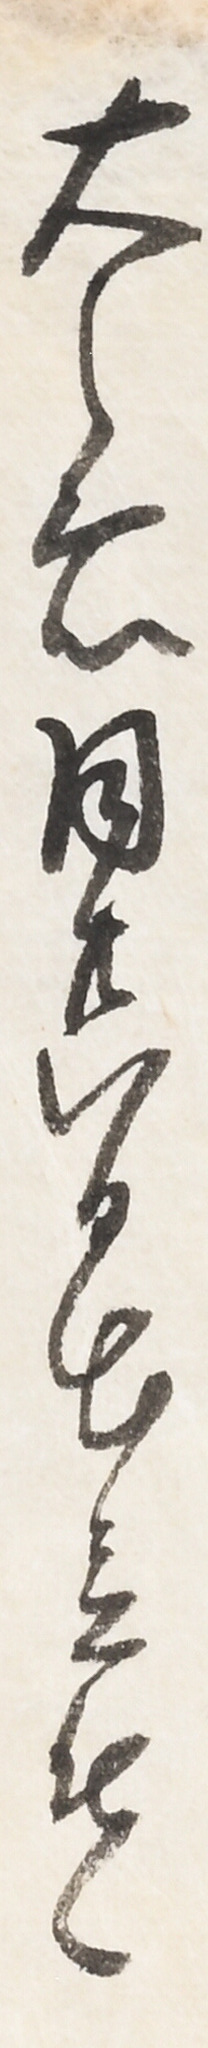右之者同廿八日出立仕候
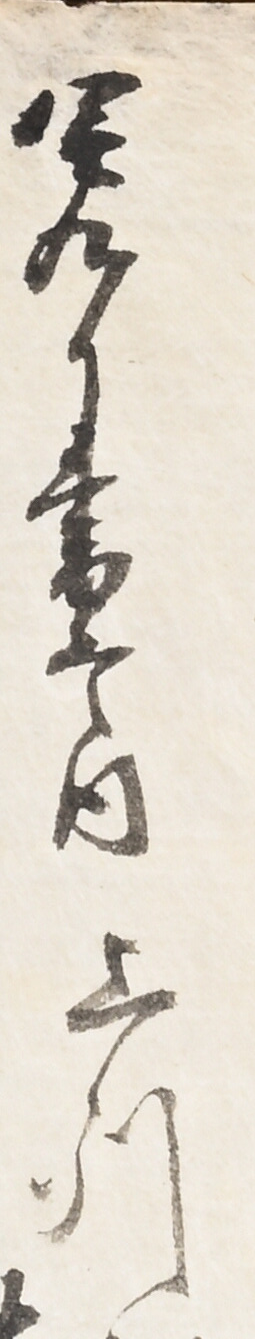閏九月書上之内上州桐生
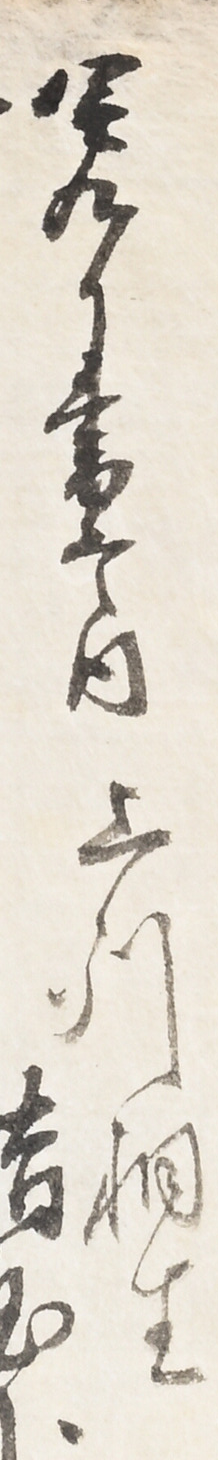閏九月書上之内上州桐生
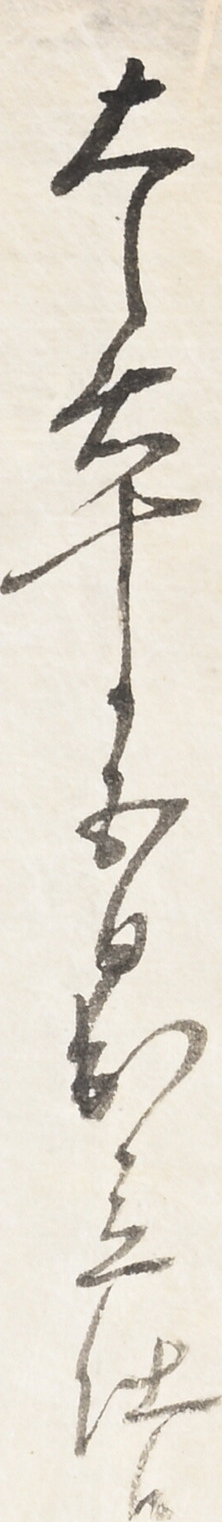右之者十月五日出立仕候
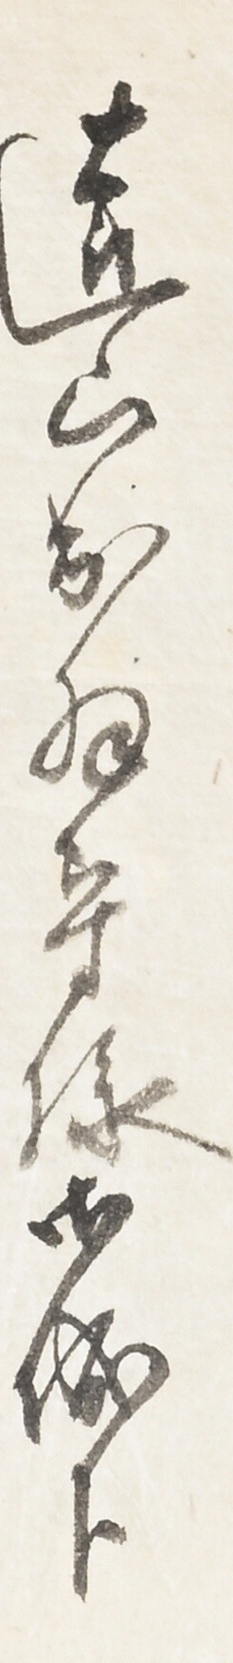遠山出羽守様御城下
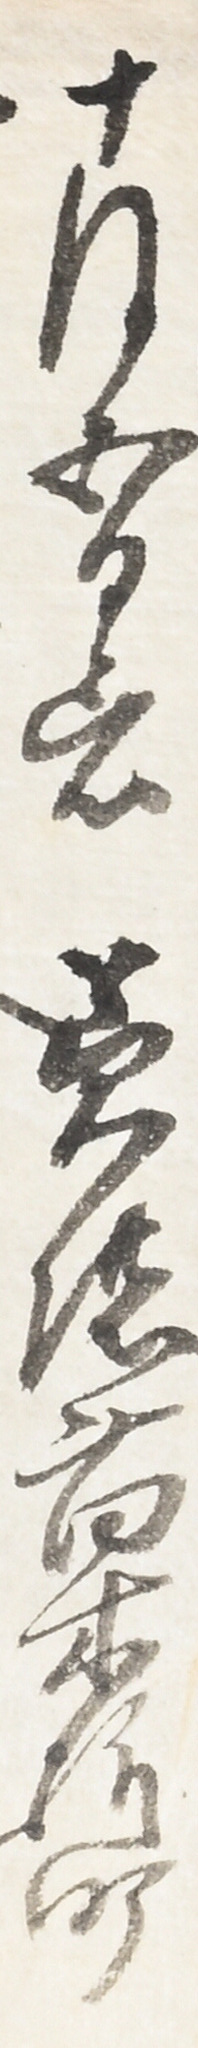十月五日着美濃苗木折町
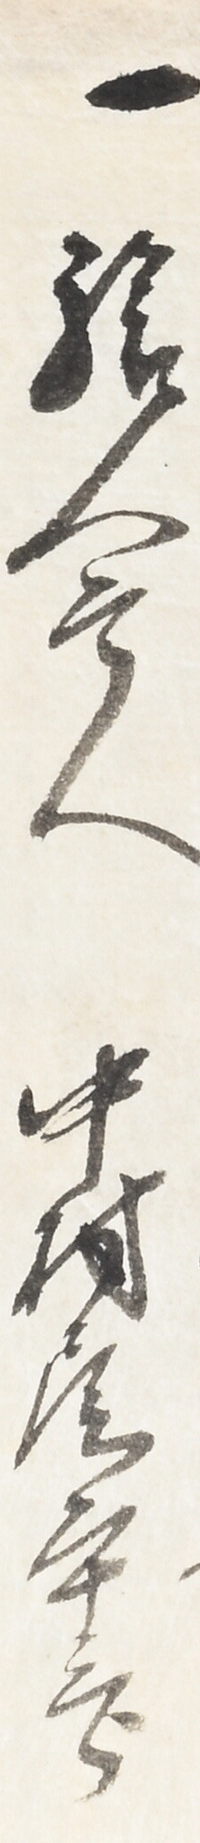一旅人壱人中村屋平三郎
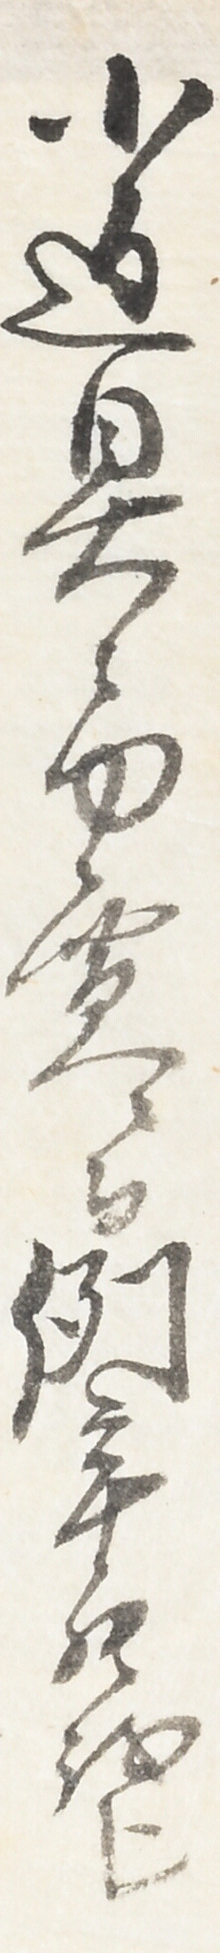小道具商売ニ而例年罷越申候
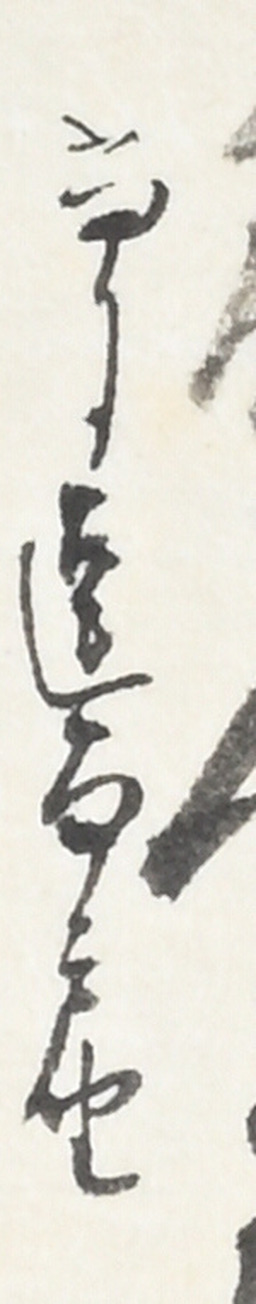当月達而候届
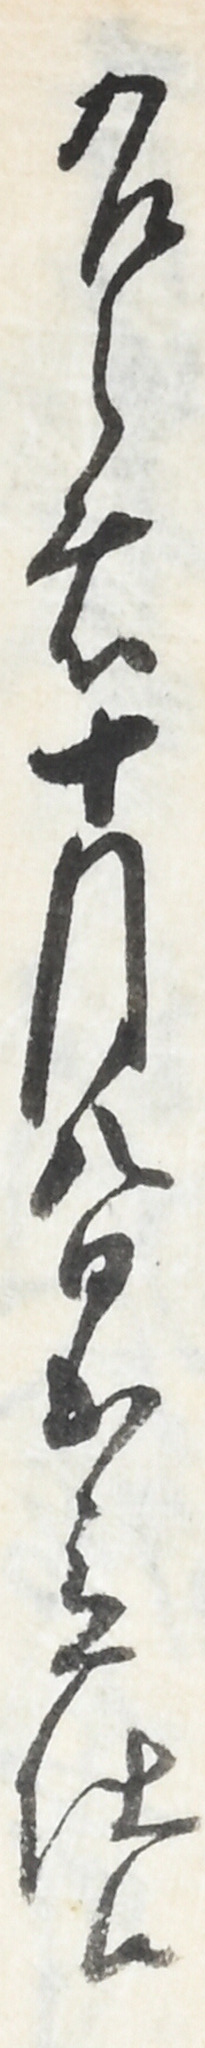右之者十月五日出立仕候

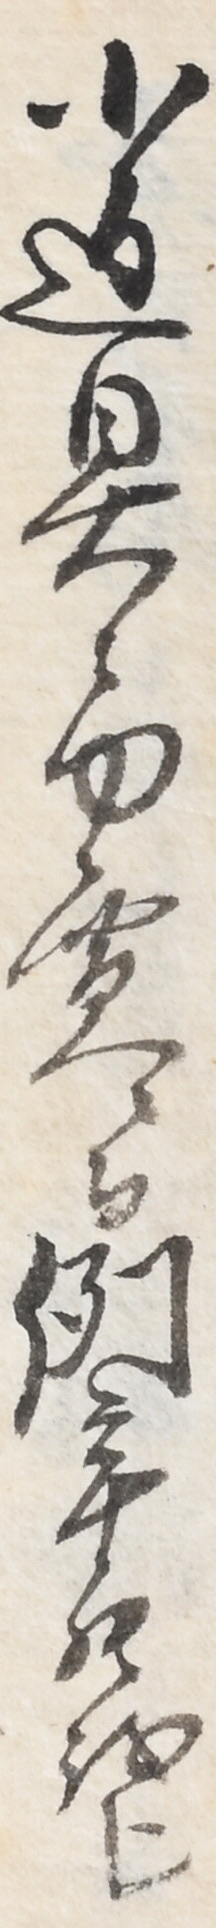小間物商売ニ而例年罷越申候
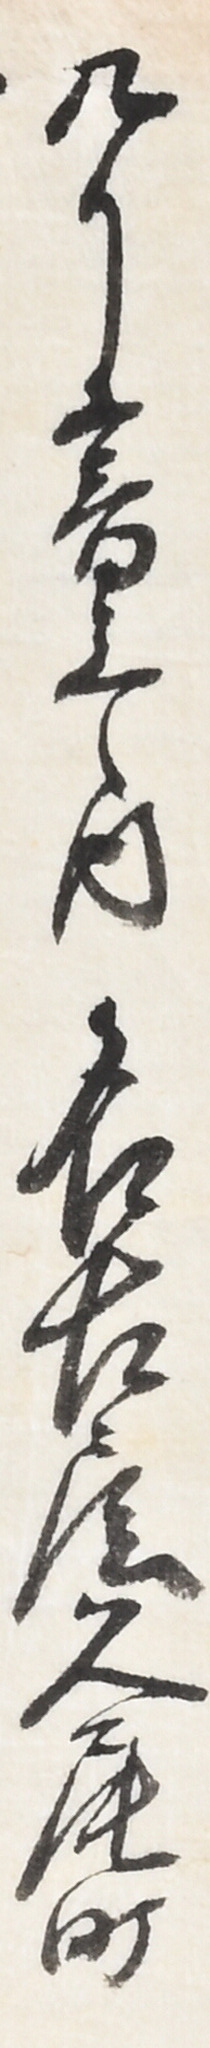九月書上之内名古屋久尾町
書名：旅人泊控帳
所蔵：伊那市立高遠町図書館・合同会社AMANE
